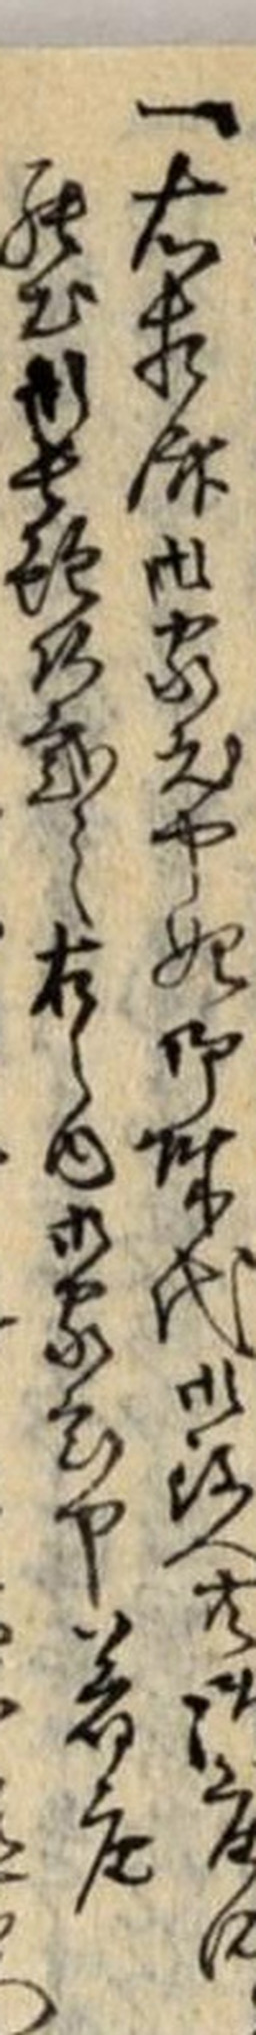罷出御長蚫頂戴之右之内御家老中着座
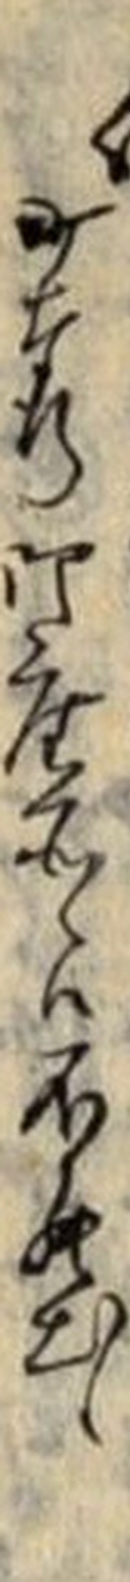町奉行御座所へは不罷出候
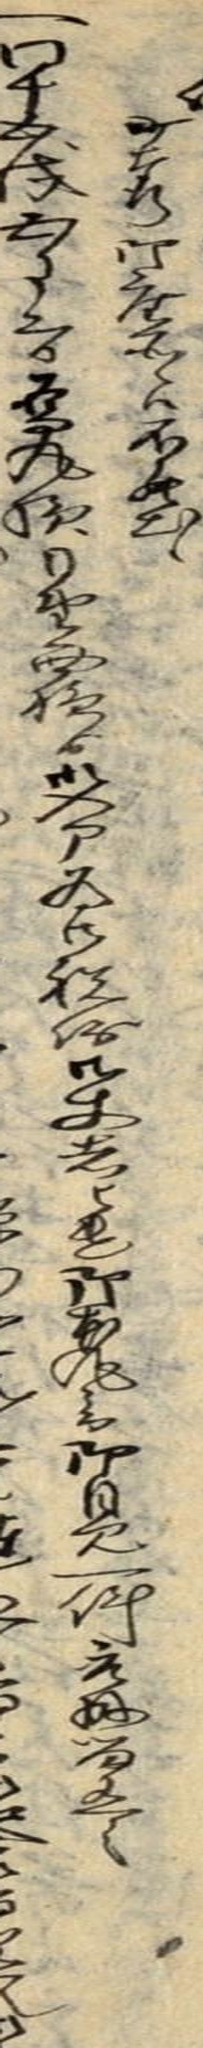一同十五戌五月二日烏丸様日野西様ゟ御入部為御祝儀御使者被遣御本丸に而御目見一件取扱留有之
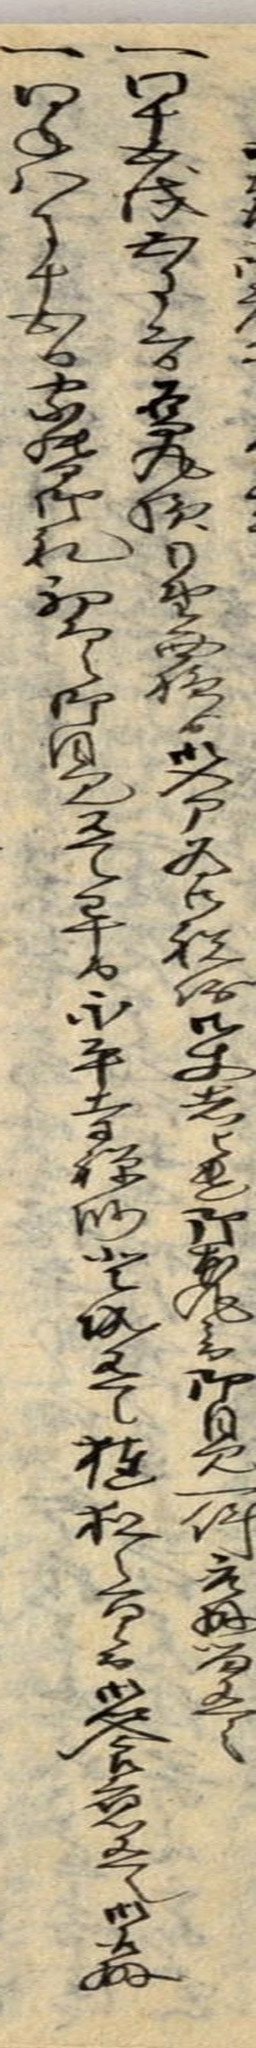一同年八月十五日家督御礼初而之御目見有之畢而永平寺禅師登城有之韃靼之間二而御饗応有之御取扱
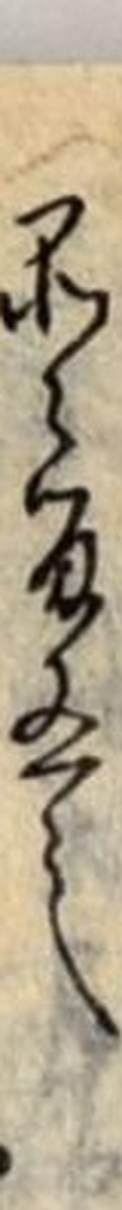品之留有之
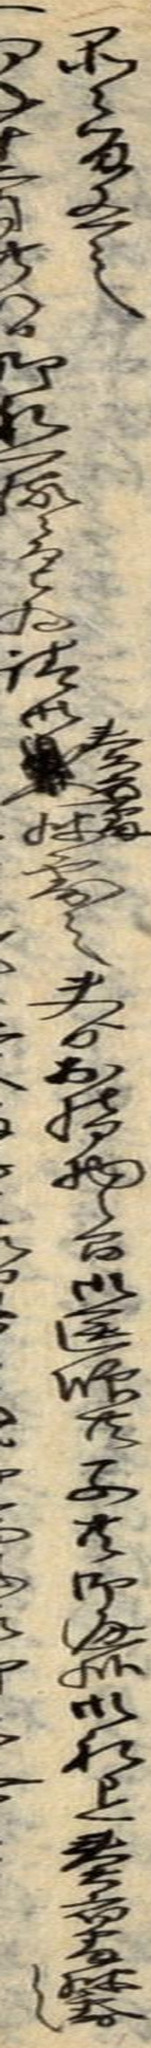一同年十二月廿八日御礼一統に而被為請候御奏者番披露之夫ゟ於指物之間御医師共子共御通掛御礼申上奏者番披露之
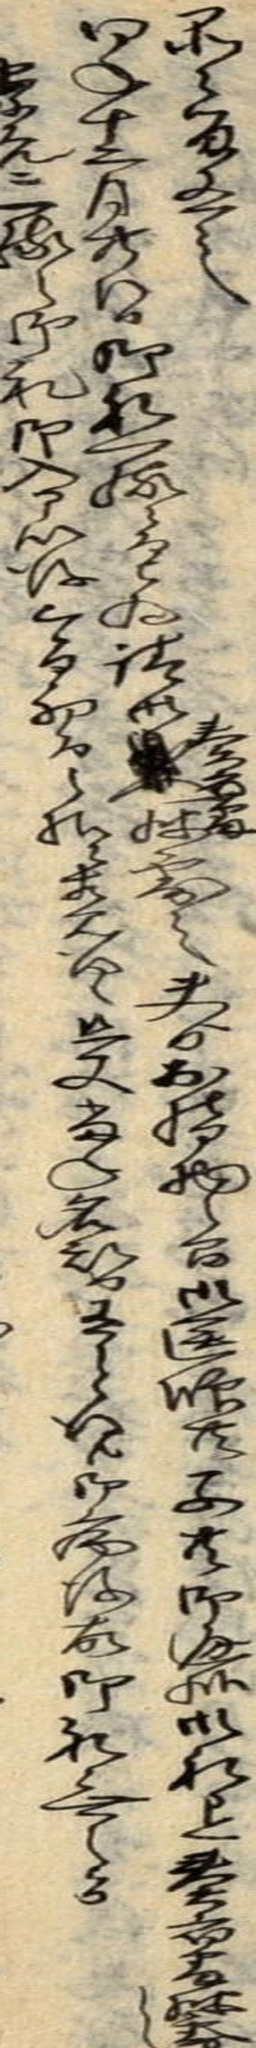御家老に一統之御礼御入部以後今日初而之様に相見得候且又当年名替有之候得共御病後故御礼無之旨
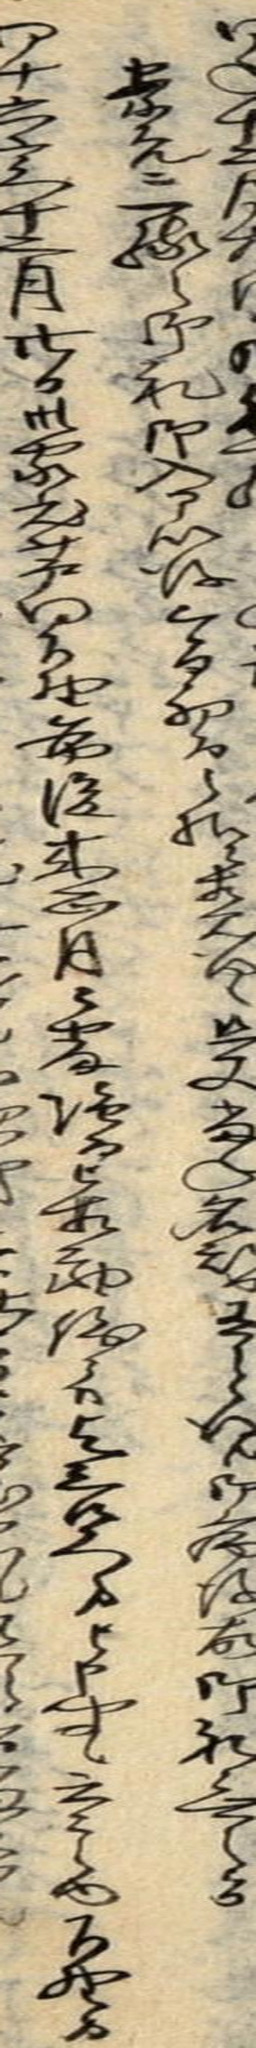一同十六亥十二月廿日御家老芦田下野病後来正月に番強而相勤候儀に付与三左衛門方被申聞候云々之内下野方
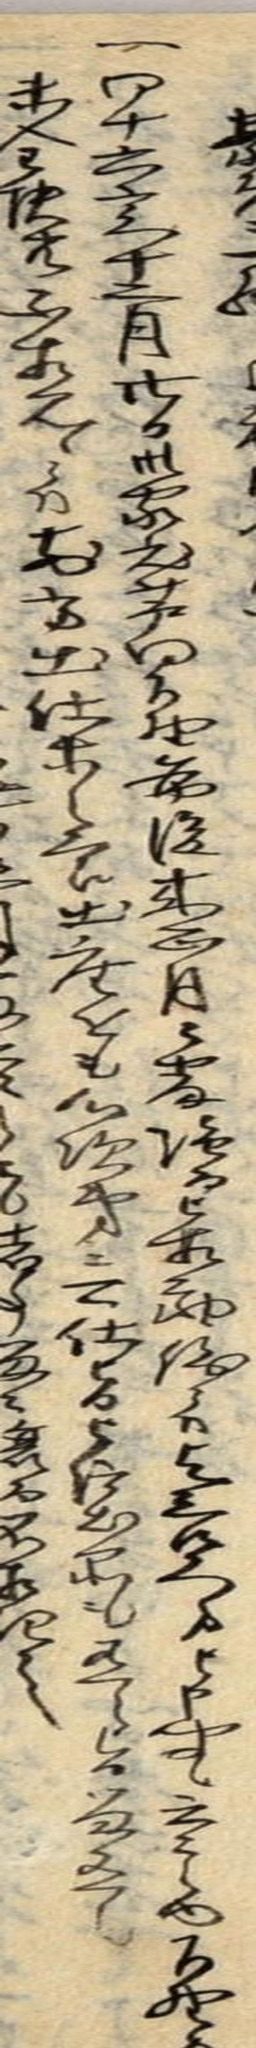未全快共不相見候に付前方出仕等之節出座をも心次第に可仕旨被仰出品も有之旨留有之
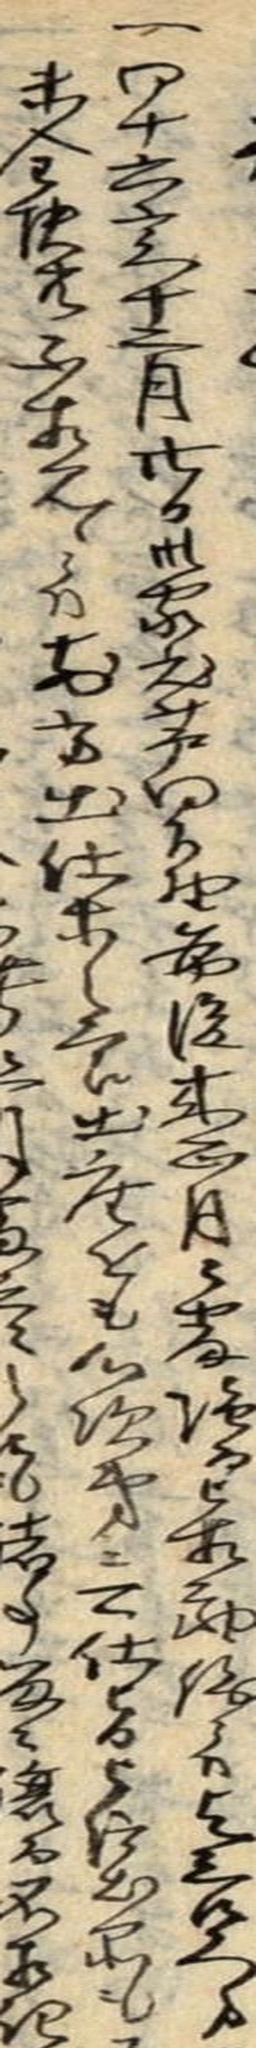未全快共不相見候に付前方出仕等之節出座をも心次第に可仕旨被仰出品も有之旨留有之
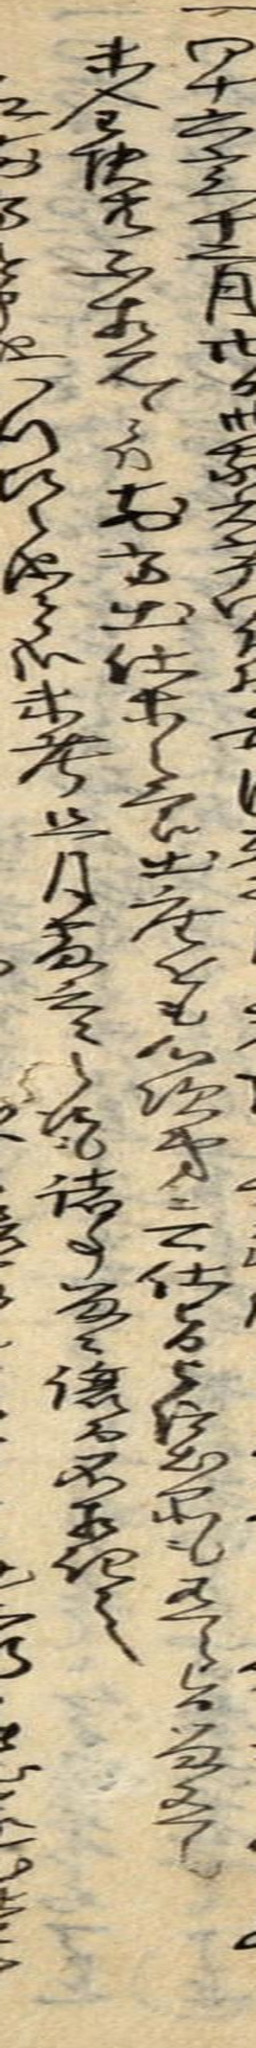但前方と申儀いつ頃之儀に候哉未考候且月番云々之儀も諸事留に譲而不相記之
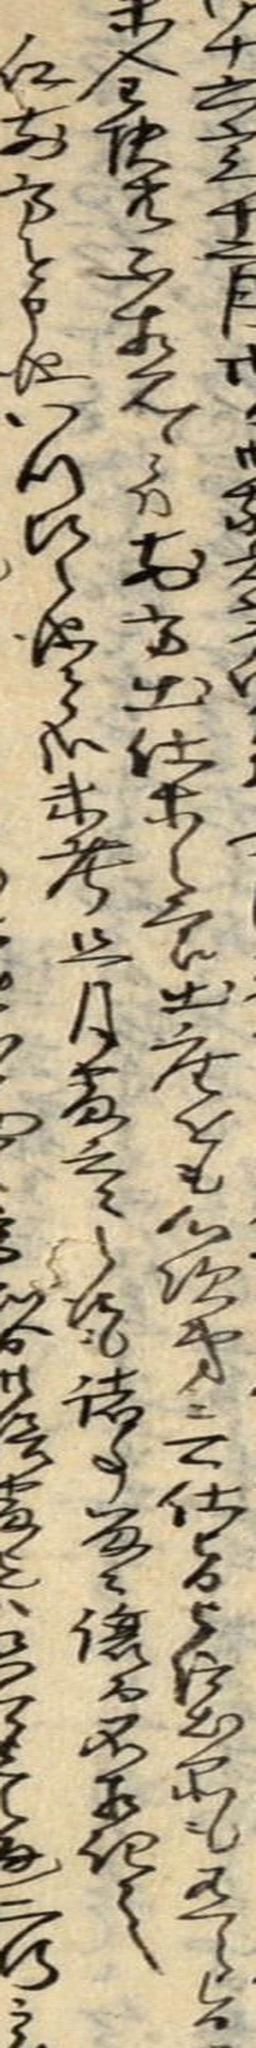但前方と申儀いつ頃之儀に候哉未考候且月番云々之儀も諸事留に譲而不相記之
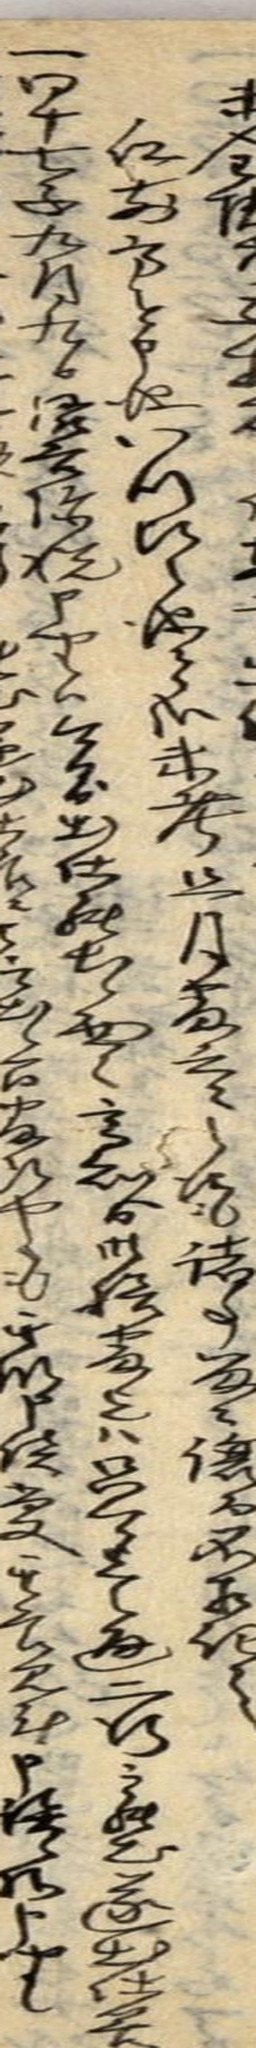一同十七子九月九日渋谷弥税申聞候は今日ゟ出仕罷出候面々高知ゟ御膳番迄は只今迄之通二行に罷出遂出仕候筈候
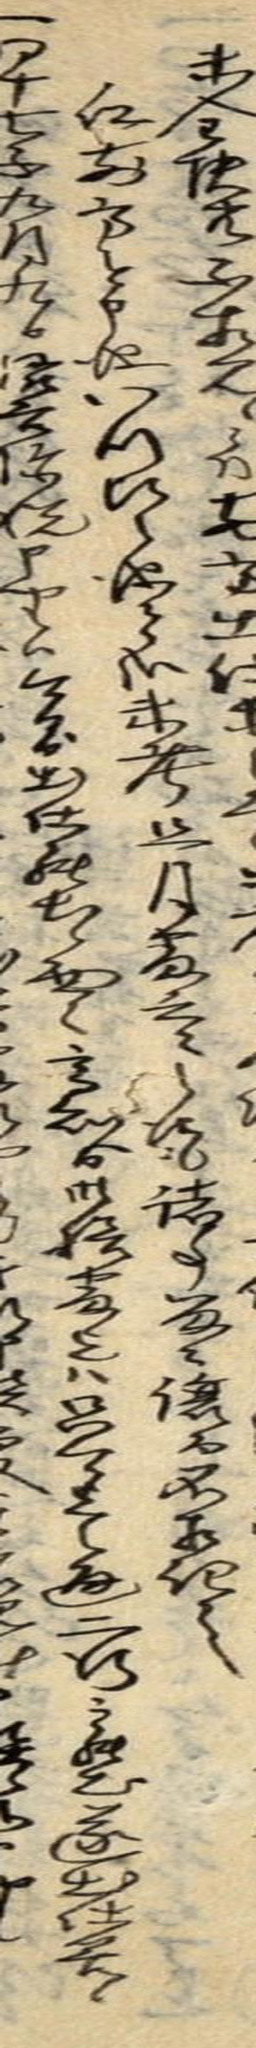一同十七子九月九日渋谷弥税申聞候は今日ゟ出仕罷出候面々高知ゟ御膳番迄は只今迄之通二行に罷出遂出仕候筈候
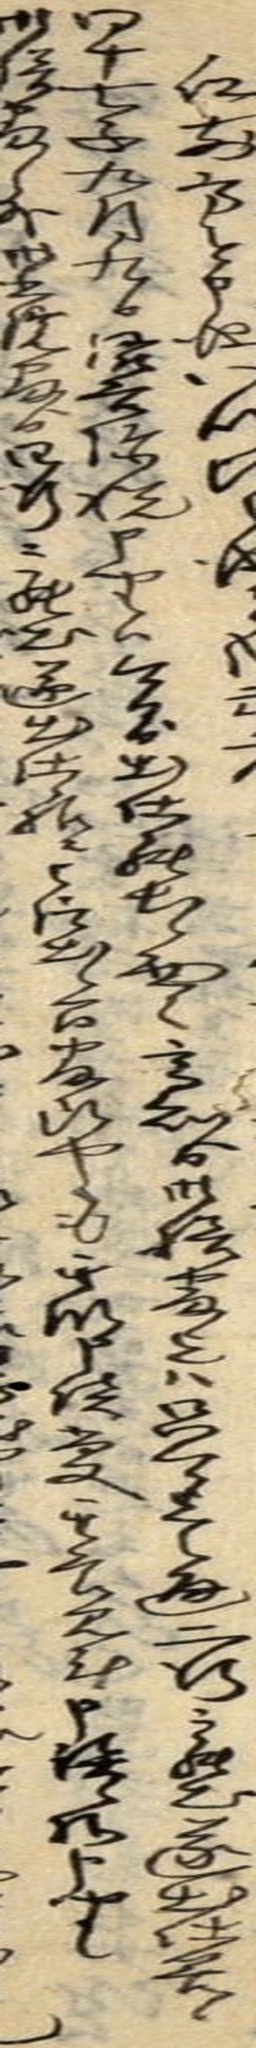御膳番之外御書院番ゟ四行に罷出遂出仕候様に被仰出候間番頭中へも其段申談尚又其節見計申談候様申聞候
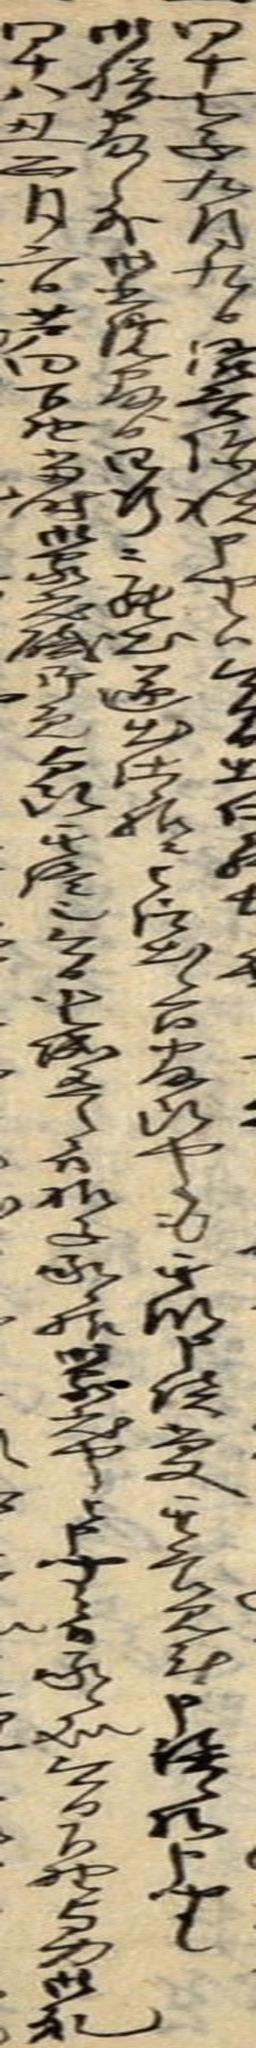一同十八丑正月二日芦田下野当時御家老職御免与頭其侭也今日登城有之候に付様子承候様御家老中被申聞候付承候処今日下野与力御礼
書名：蒐輯之部
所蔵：福井県文書館 Fukui Prefectural Archives
